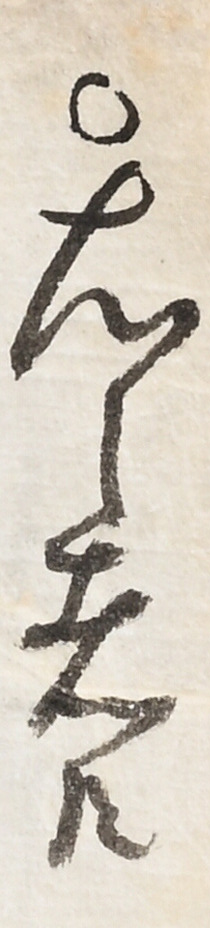〇右之者共
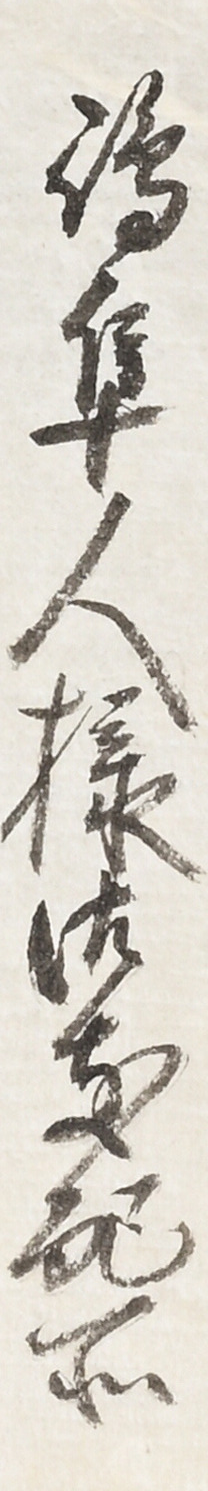嶋隼人様御支配所
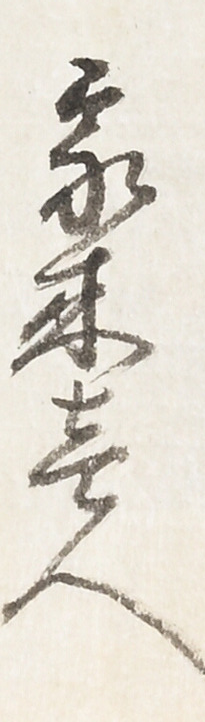家来壱人
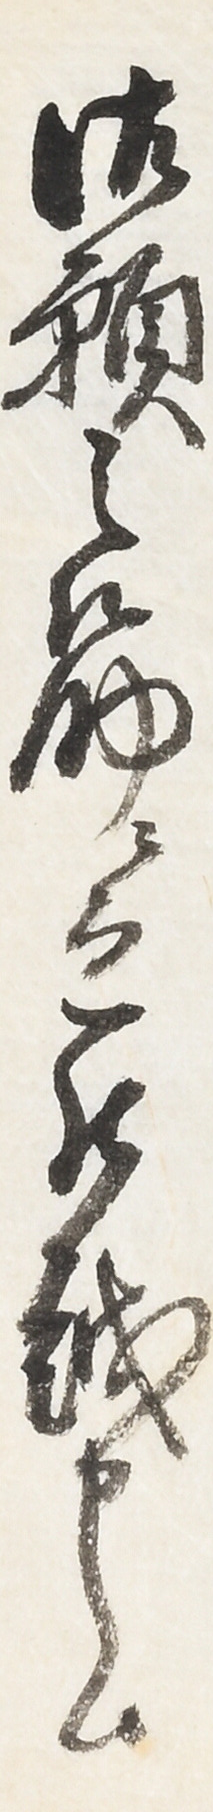御願之筋ニ而罷越申候
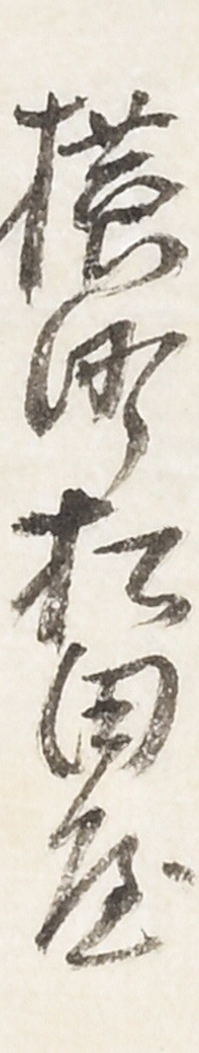横町松田屋
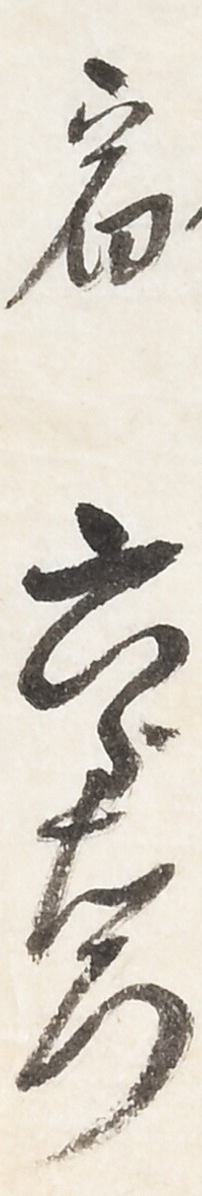宿六郎右衛門
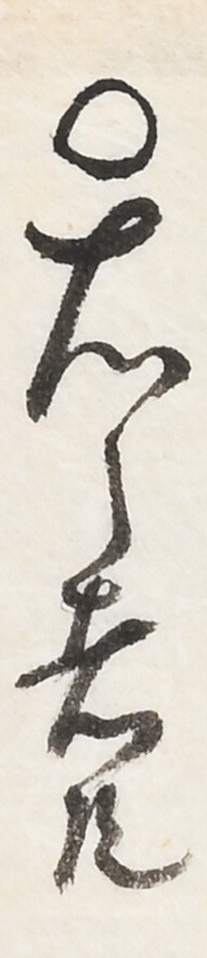〇右之者共
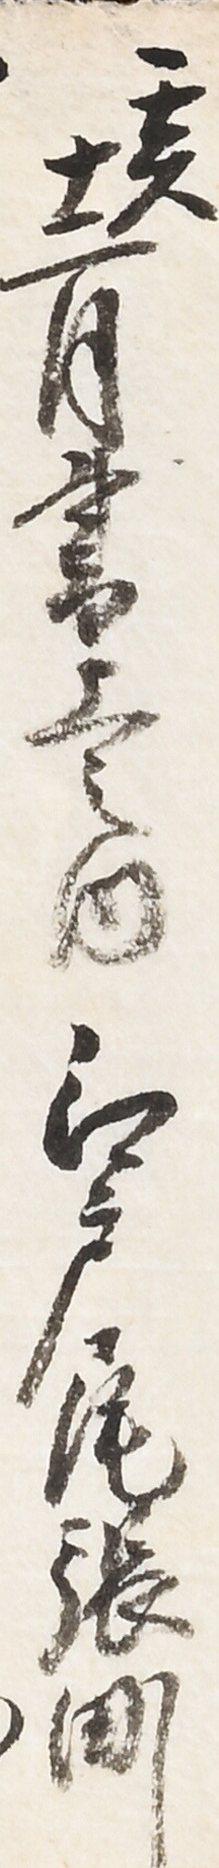十二月書上之内江戸尾張町
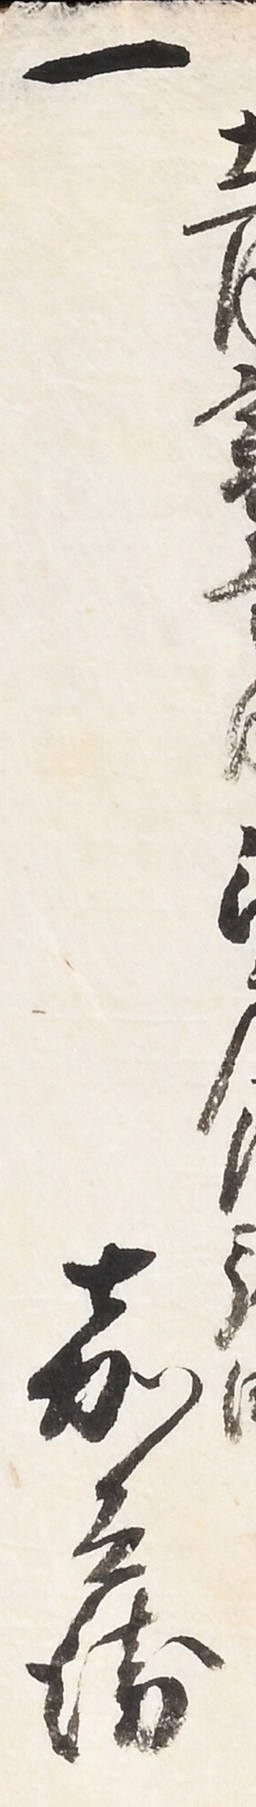一嘉兵衛
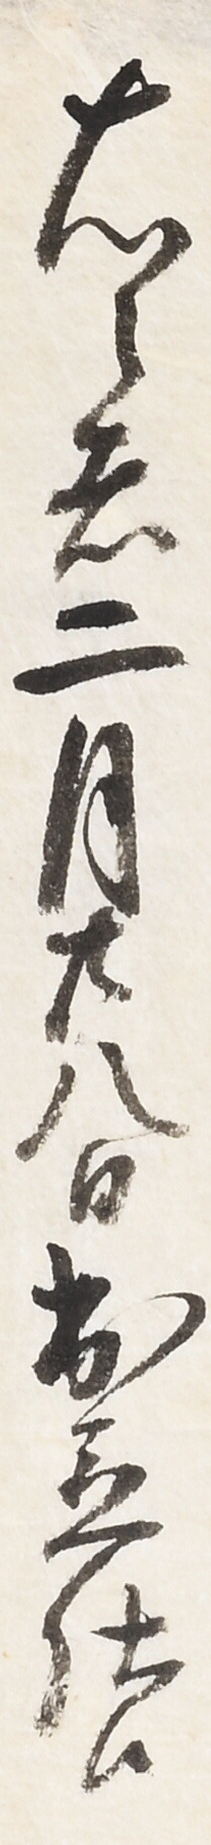右之者二月廿八日出立仕候
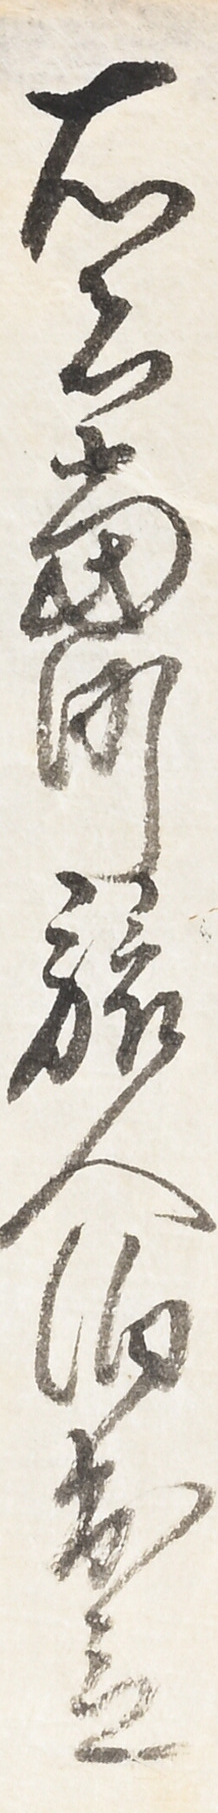右者当町旅人泊出立
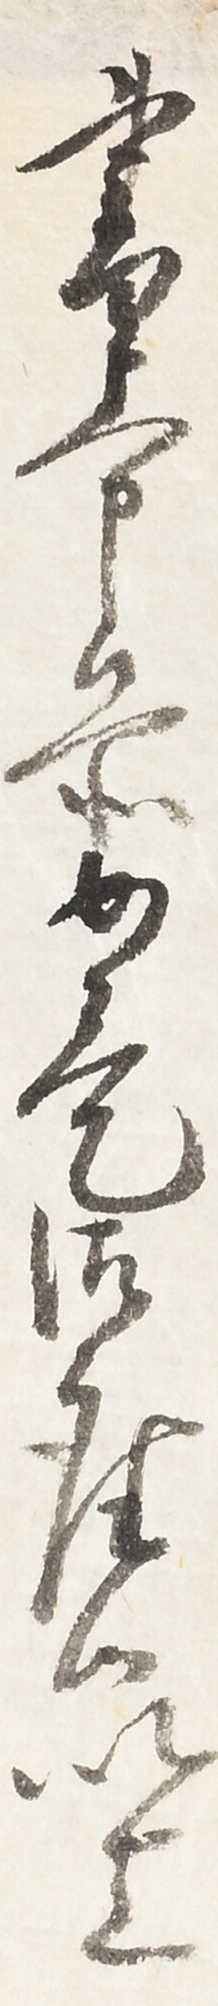書上申候所如是御座候以上

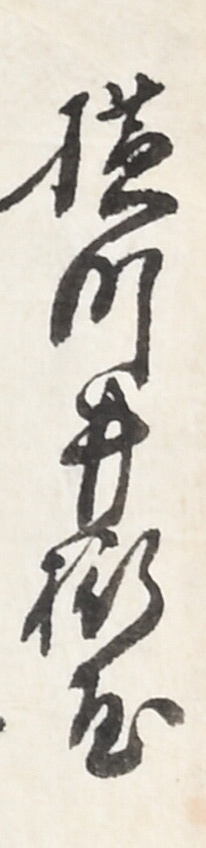横町井桁屋
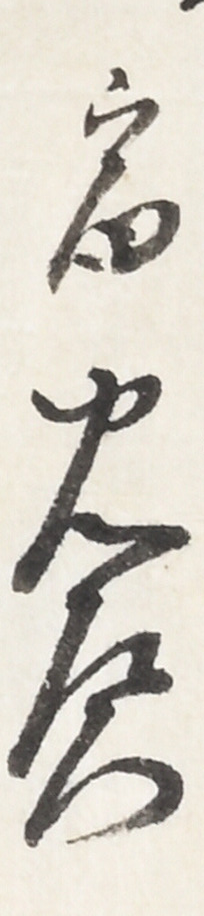宿忠左衛門
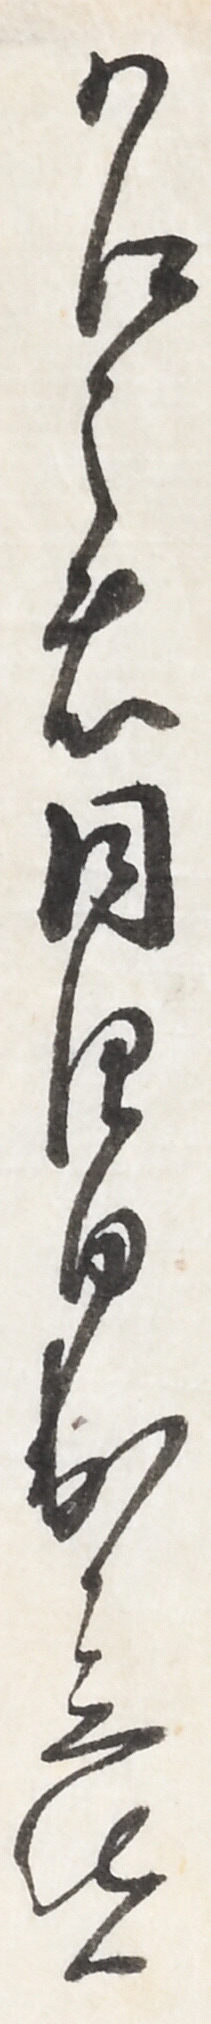右之者同四日出立仕候
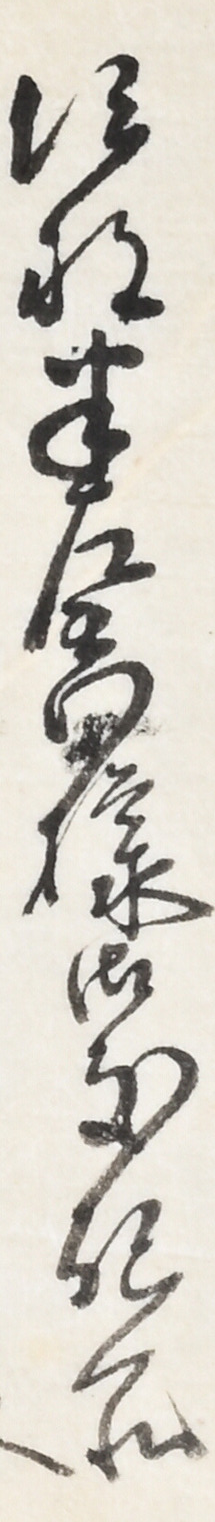伊那半左衛門様御支配所
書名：旅人泊控帳
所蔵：伊那市立高遠町図書館・合同会社AMANE
